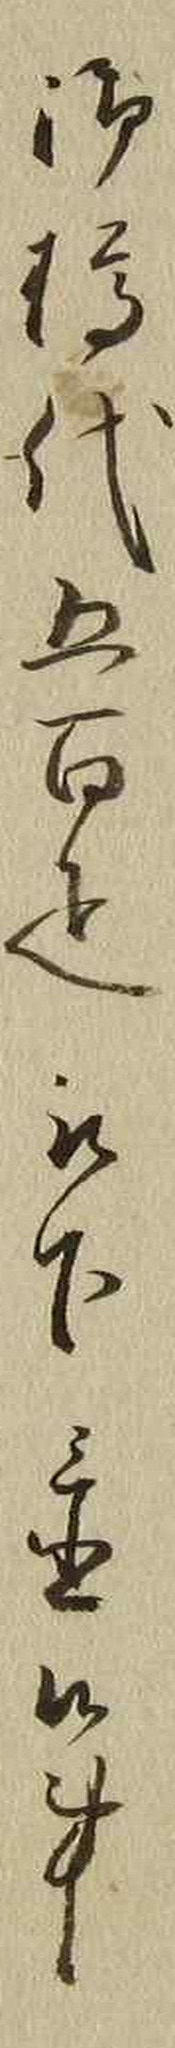御樽代五百疋被下置候事
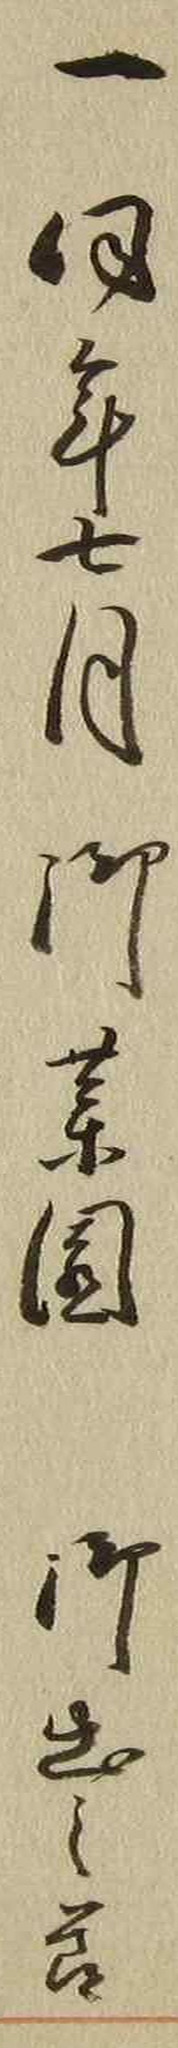一同年七月御薬園御出之節
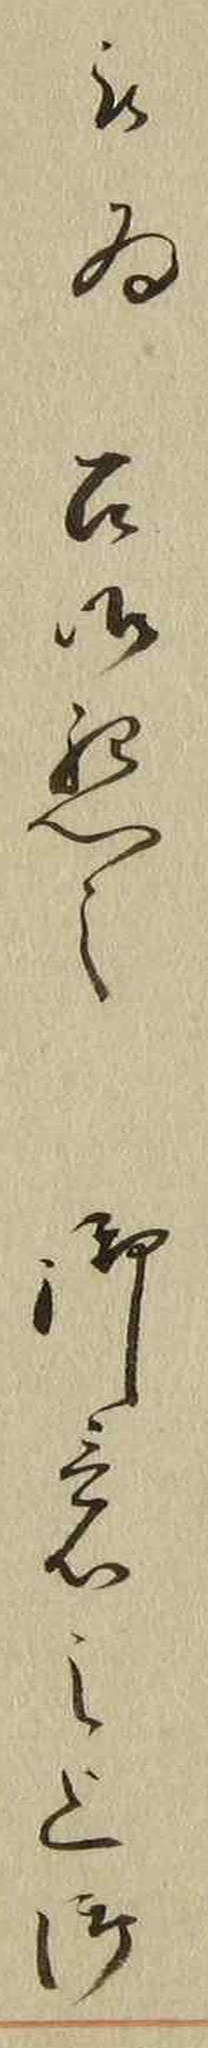被為召御懇之御意之上御
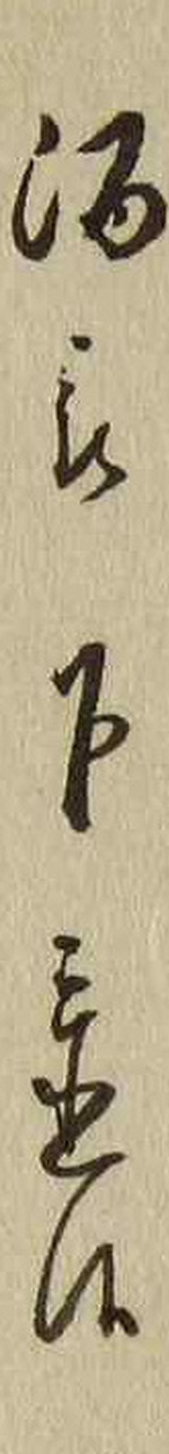酒被下置候
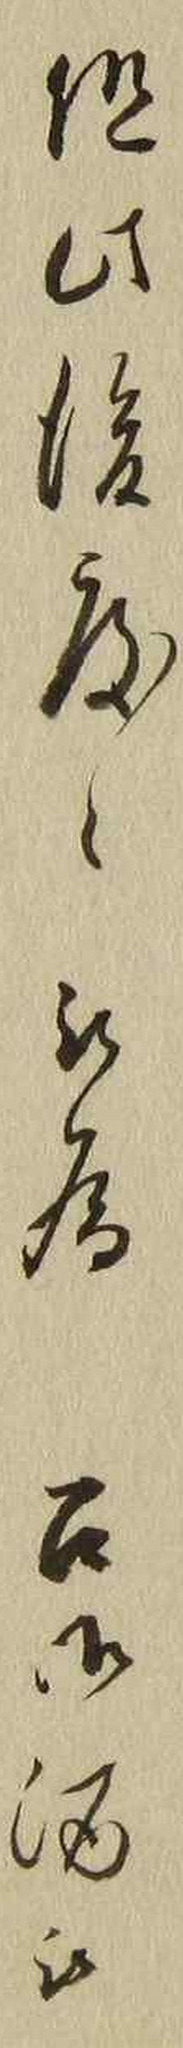但此後度々被為召御酒被
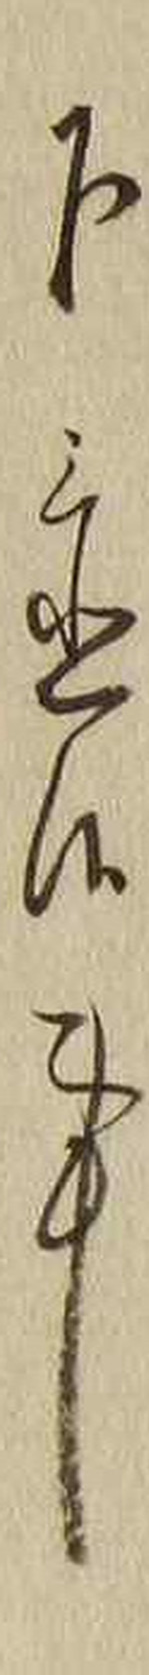下置候事
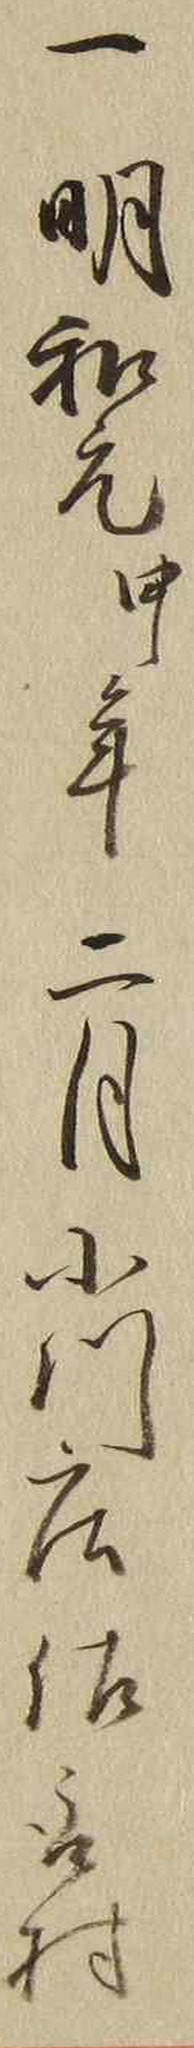一明和元申年二月小川庄佐取村
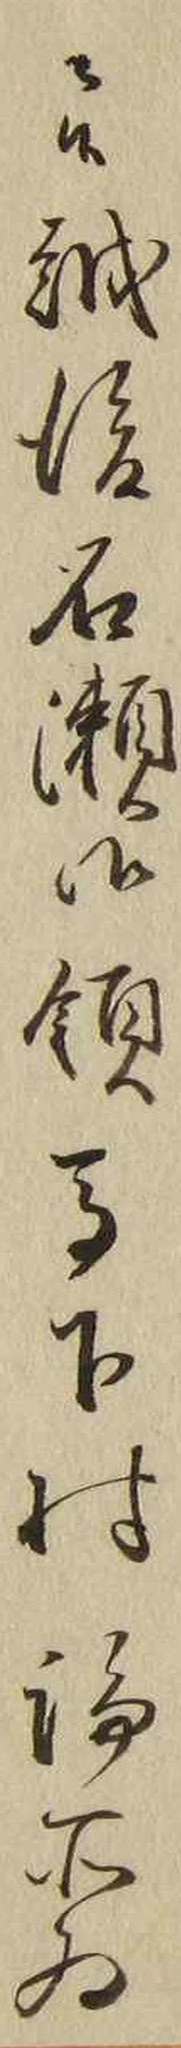二候越後名瀬御領馬下村論所為

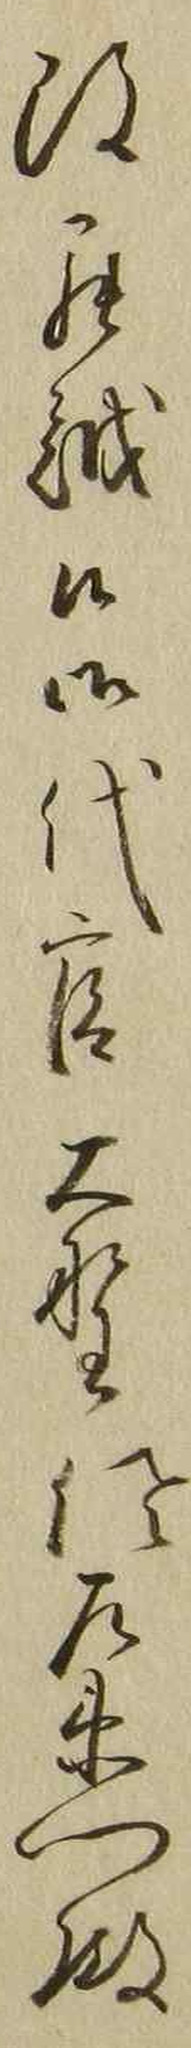改罷越候御代官大野佐左衛門殿
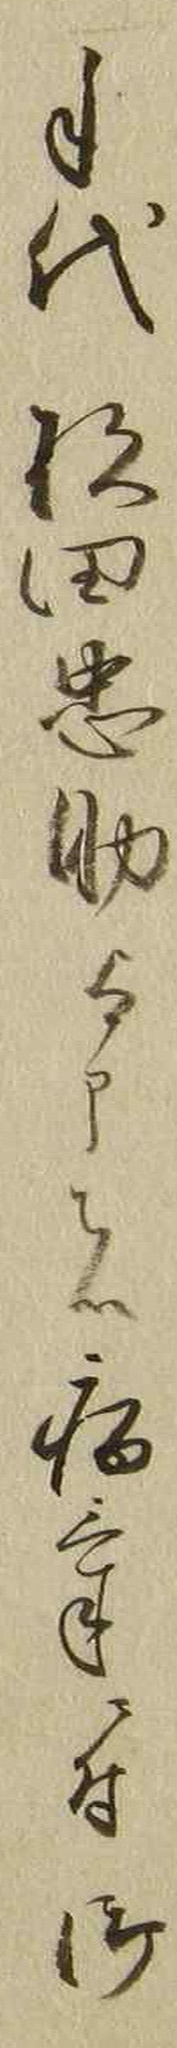手代沢田忠助与申者病気ニ付御
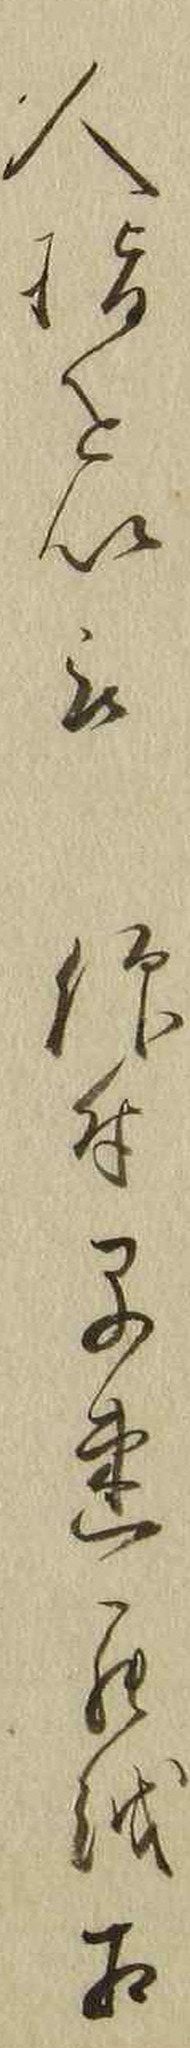人指を以被仰付早速罷越相
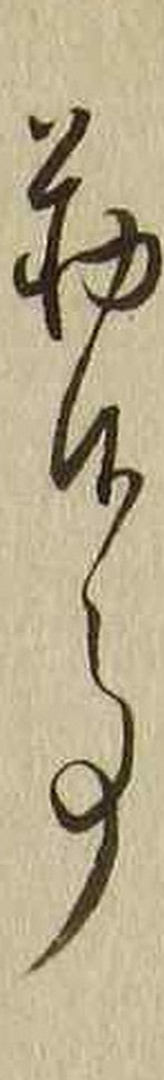勤候事
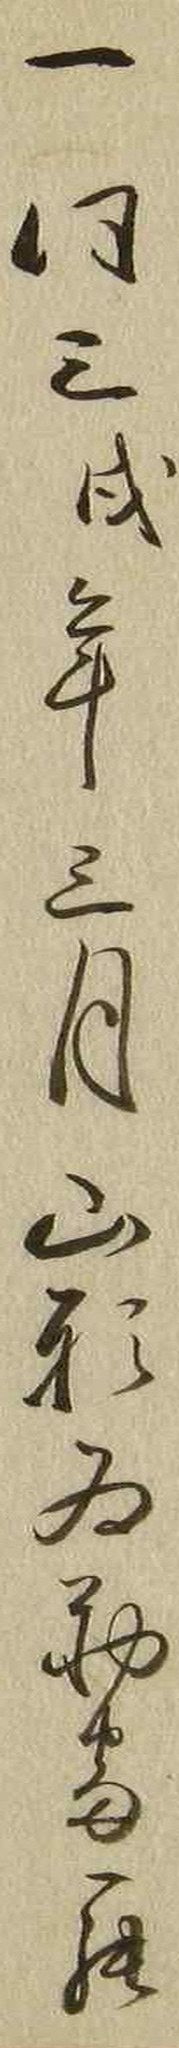一同三戌年三月山形為勤番罷
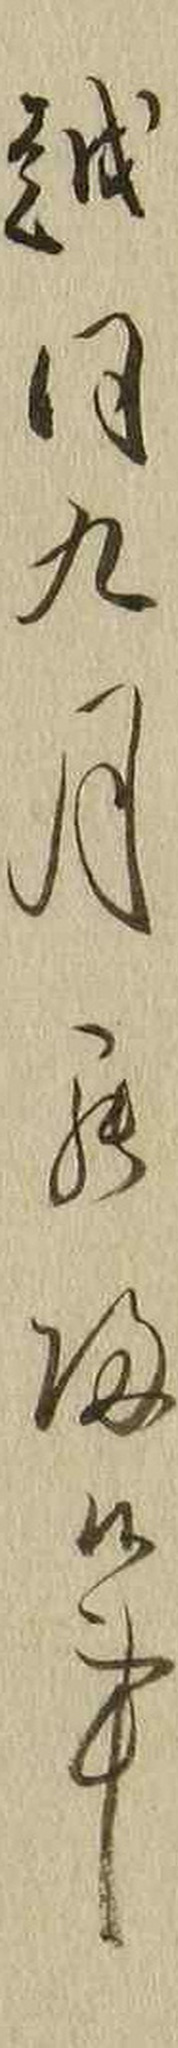越同九月罷帰候事
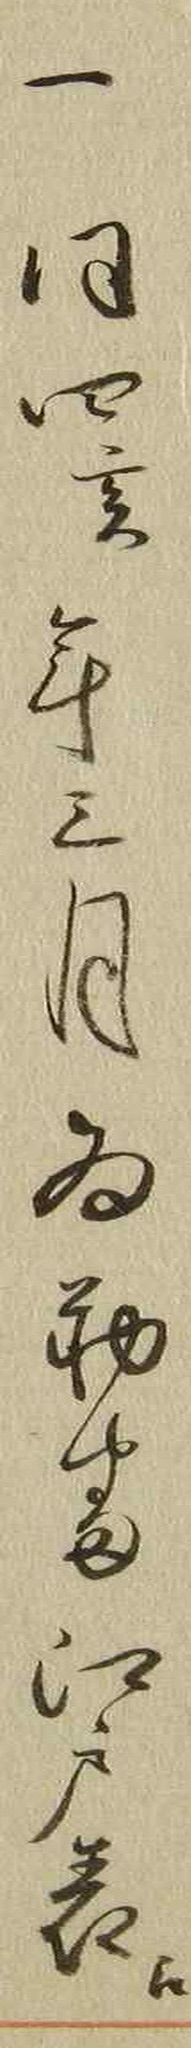一同四亥年三月為勤番江戸表江
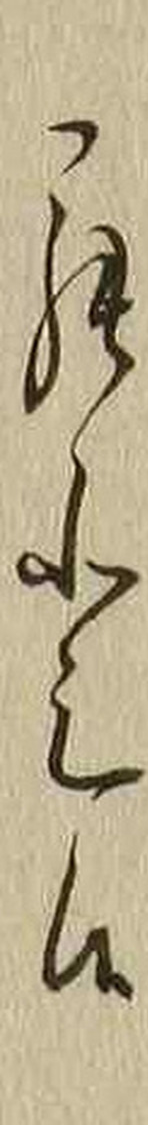罷登候
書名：諸士系譜　巻之68　を之部2
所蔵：会津若松市立会津図書館
